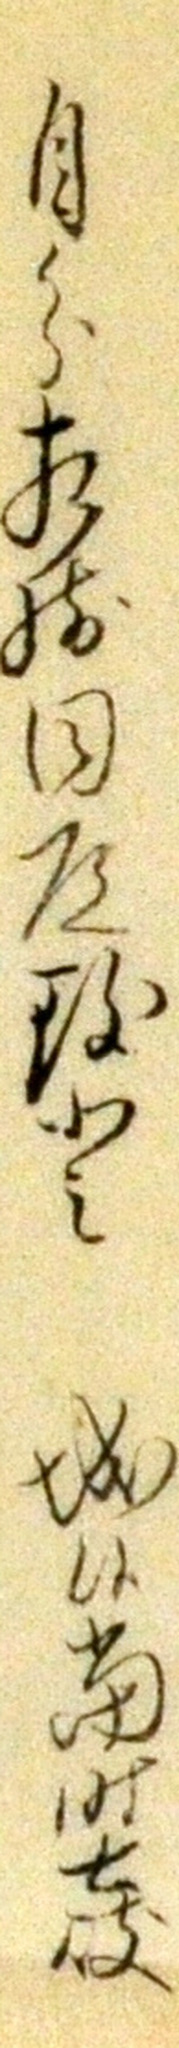自分相揃同道致登城候当時土岐
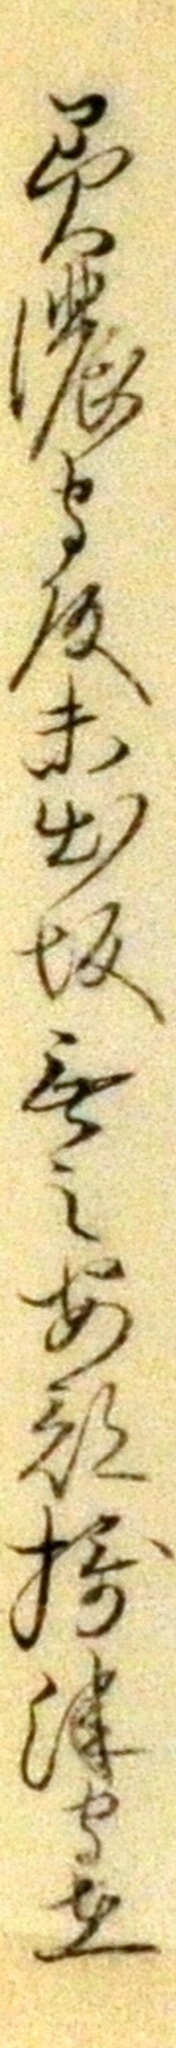美濃守殿未出坂無之安部攝津守在
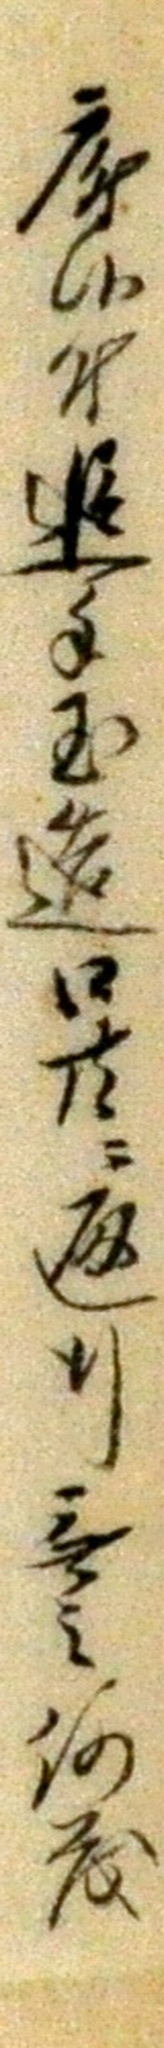府候付追手玉造口共二通行無之何も
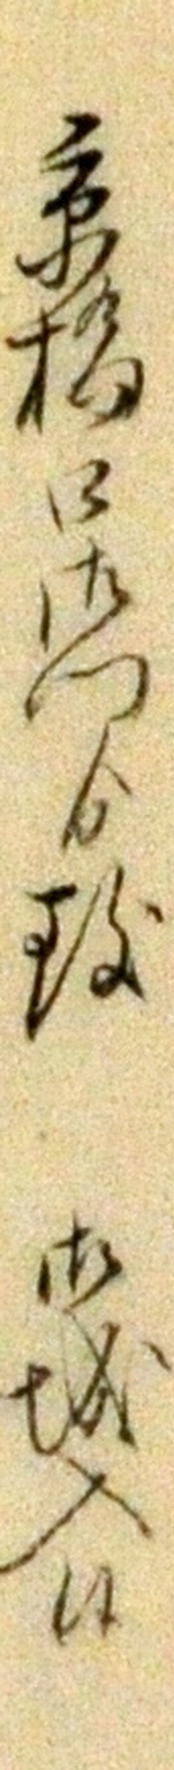京橋口御門ゟ致御城入候
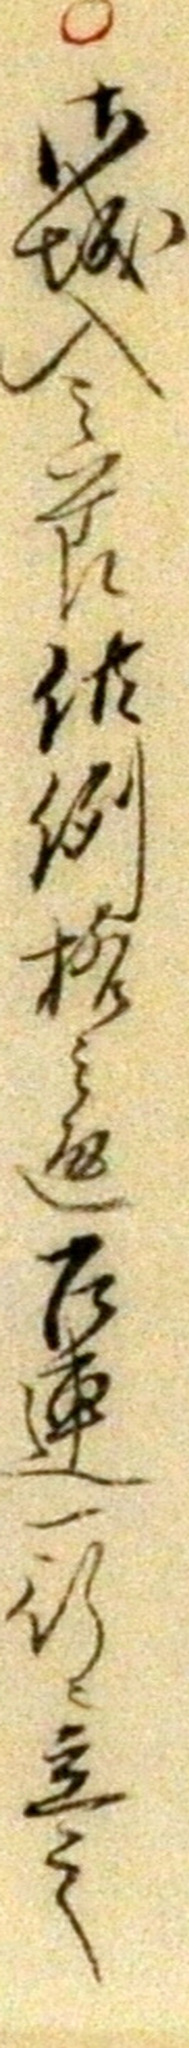御城入之節供例格之通召連一行ニ立之
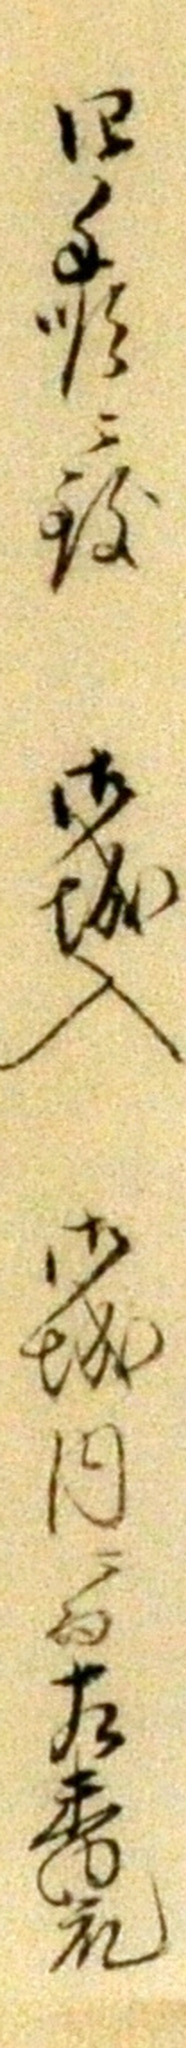口手順ニ致御城入御城内ニ而相番衆
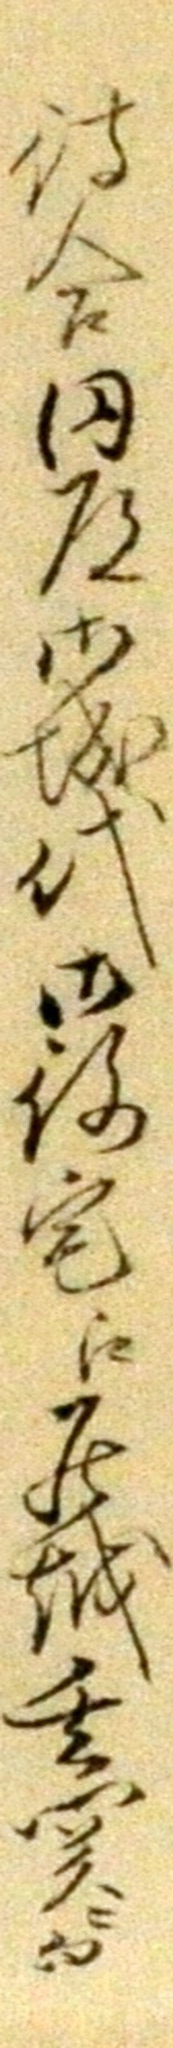待合同道御城代御役宅え罷越玄関ニ而
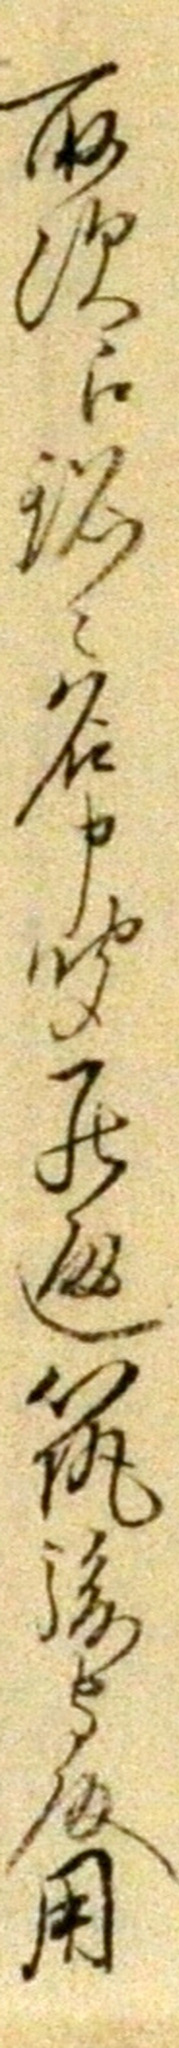取次え銘々名申聞罷通筑後守殿用
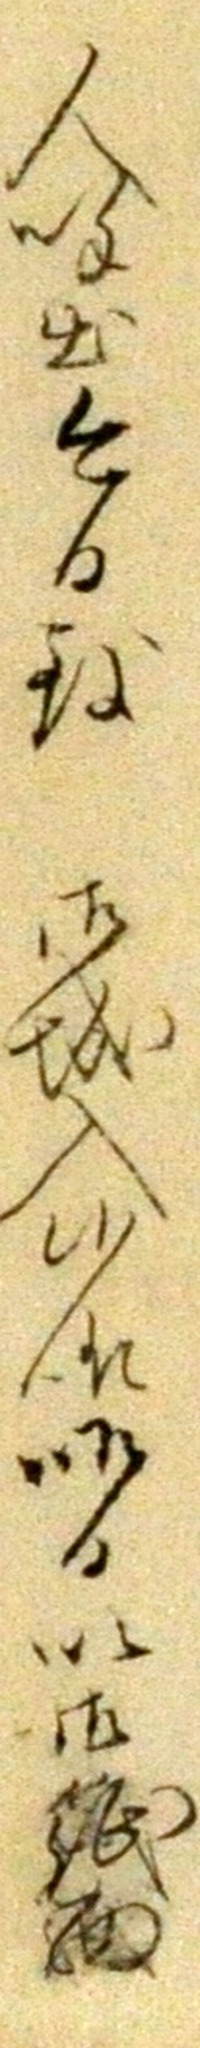人呼出今日致御城入候様昨日以御紙面
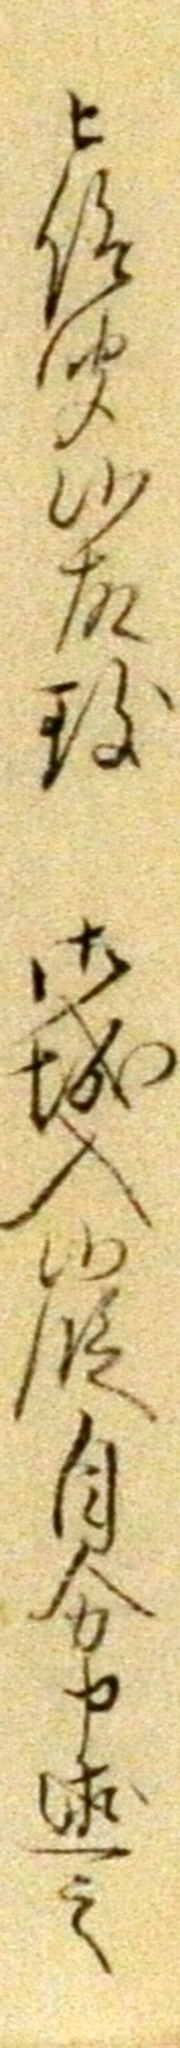被仰聞候故致御城入候段自分申述之
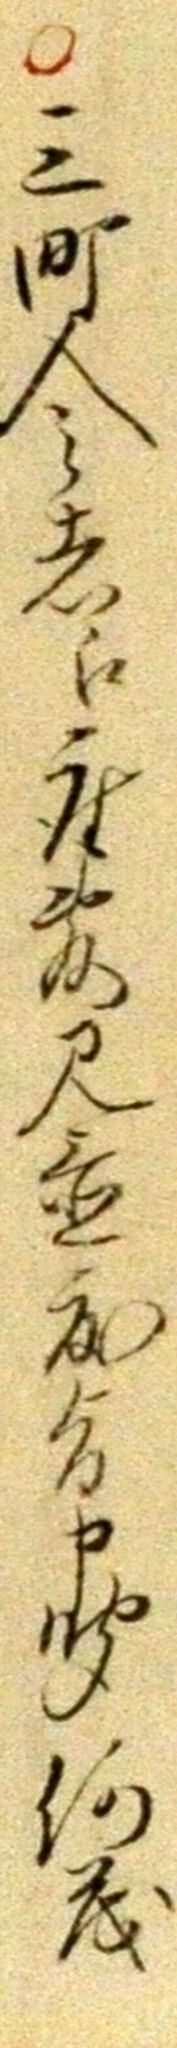三町人之者え座敷見置度旨申聞何も
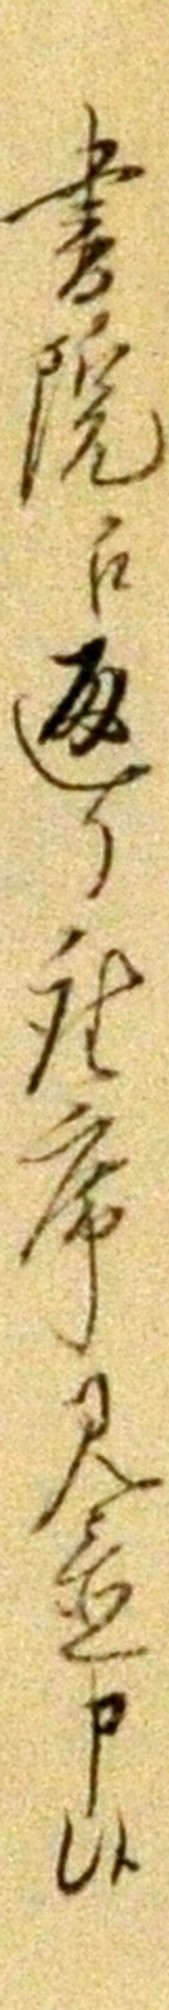書院え通り座席見置申候
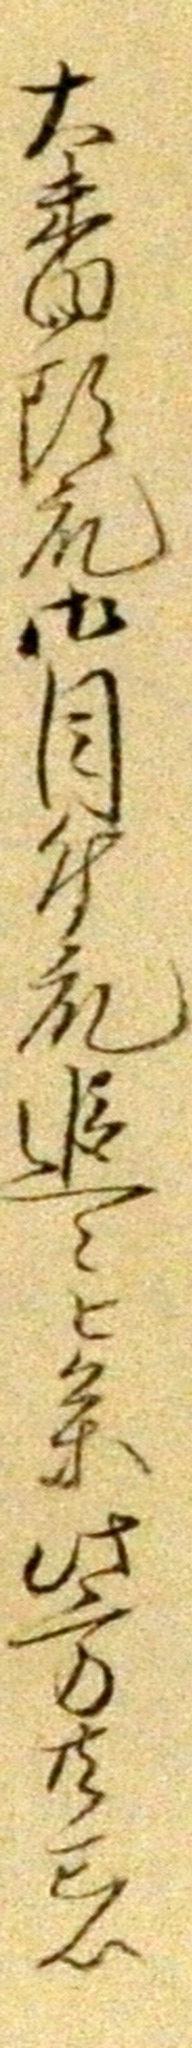大番頭衆御目付衆追々被参此方共着
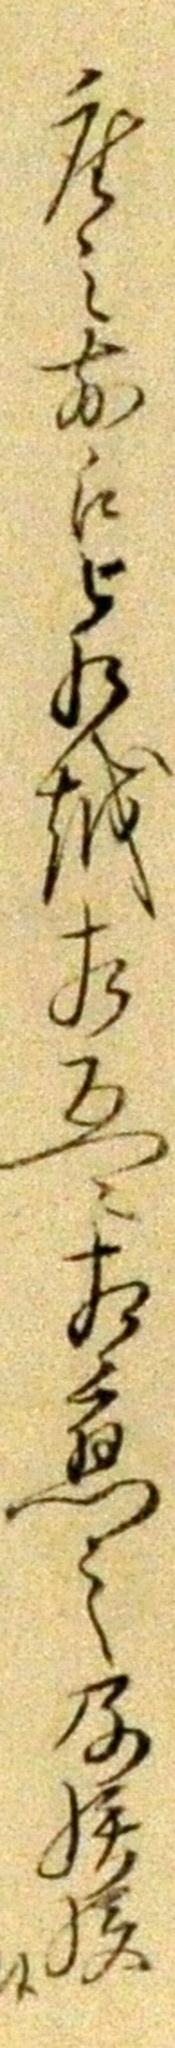座之前え被相越相互ニ相応之及挨拶候
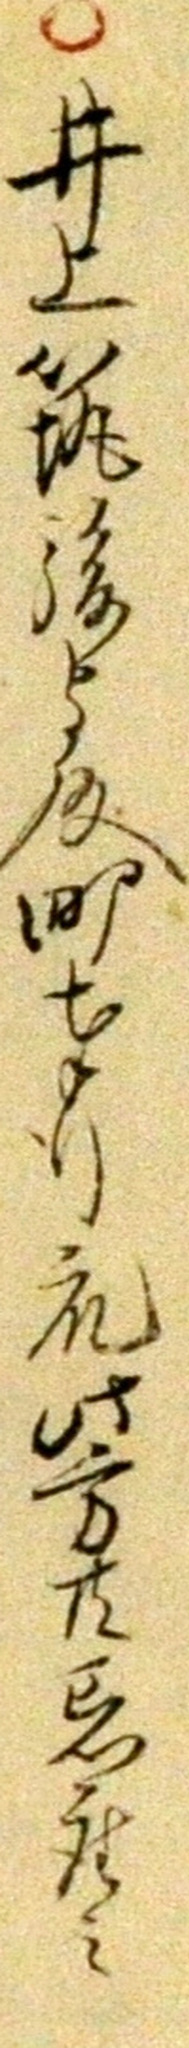井上筑後守殿町奉行衆此方共着座之
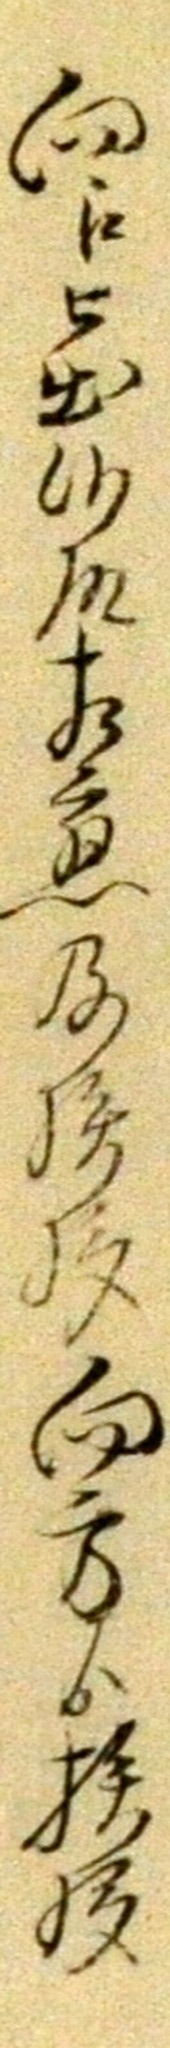向え被出候故相応及挨拶向方ゟ挨拶
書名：大阪加番関係諸書留〔一括〕
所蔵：伊那市立高遠町図書館・合同会社AMANE
